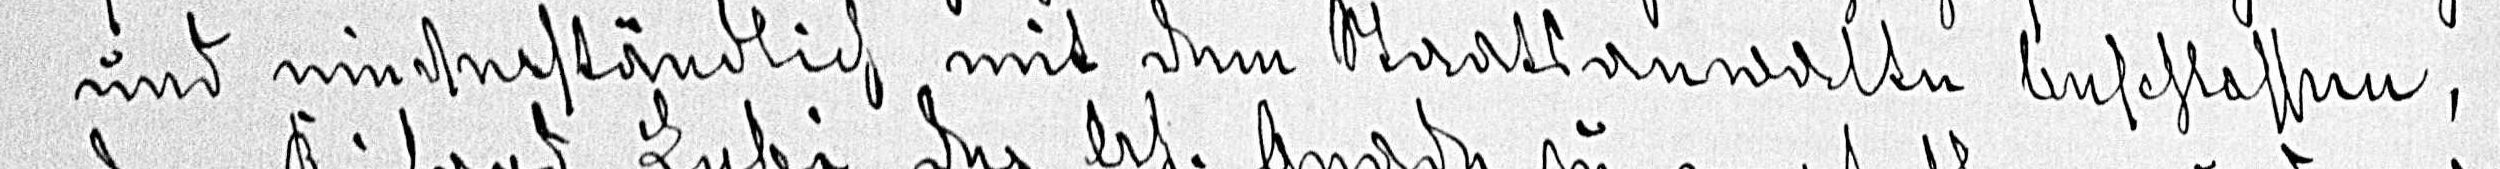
und einverständlich mit dem Staatsanwalt beschlossen,
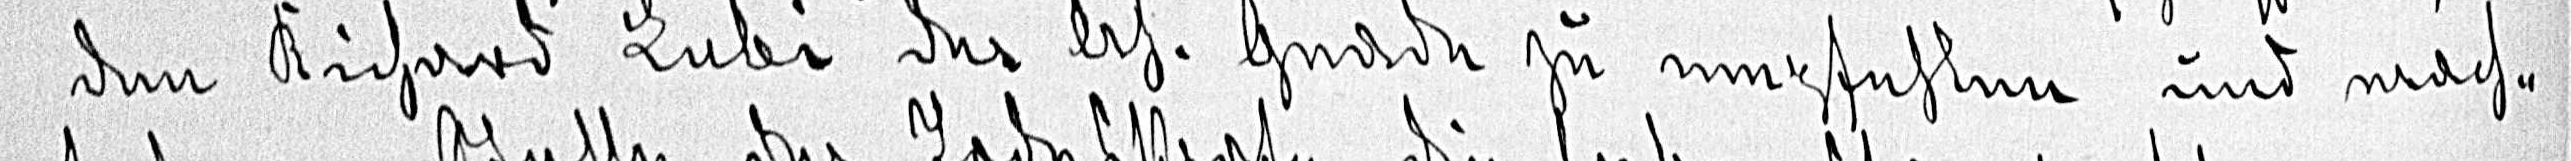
den Richard Lubi der Ah. Gnade zu empfehlen und erach¬
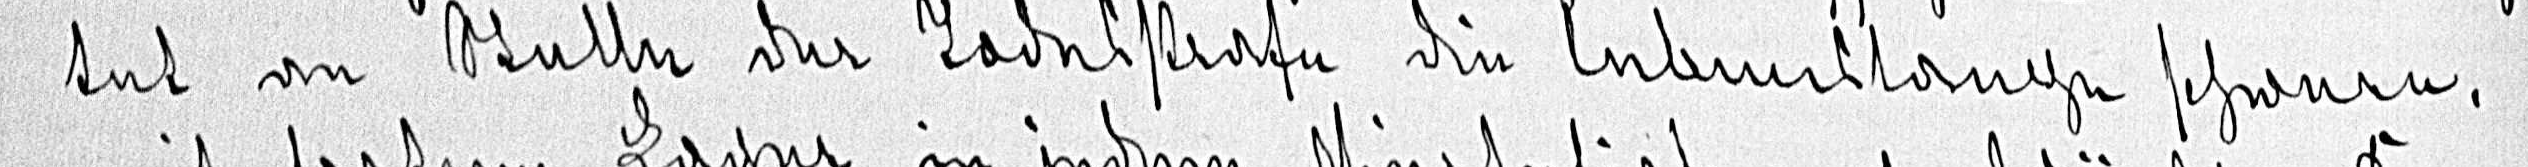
tet an Stelle der Todesstrafe die lebenslange schwere,
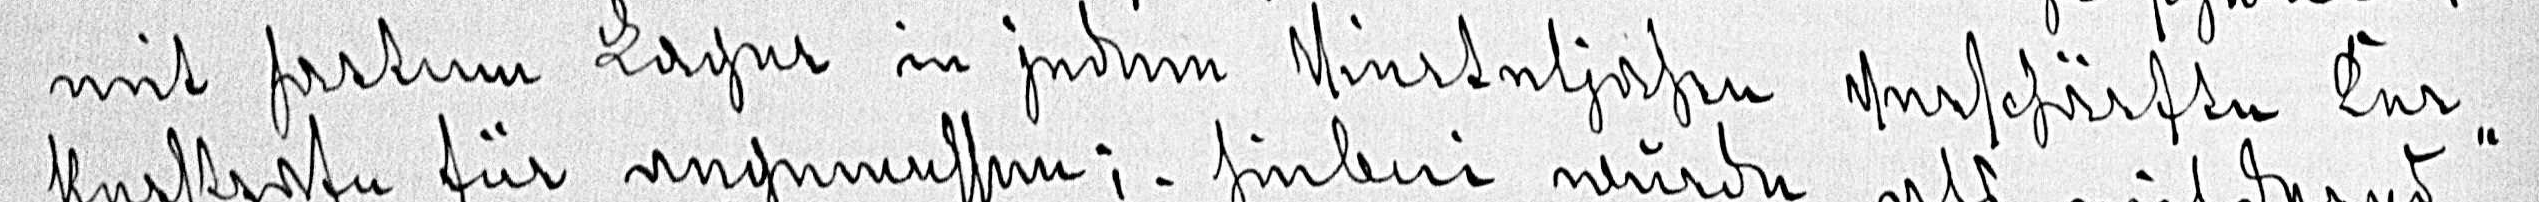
mit hartem Lager in jedem Vierteljahre verschärfte Ker¬
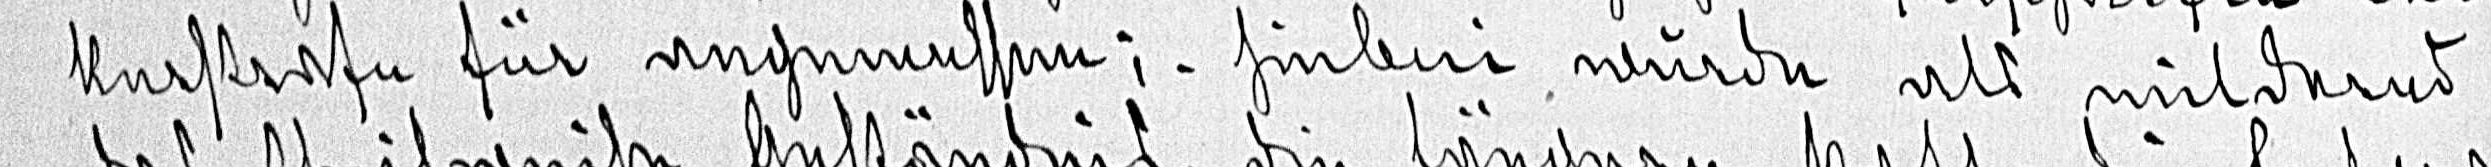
kerstrafe für angemessen; hiebei wurde also mildernd
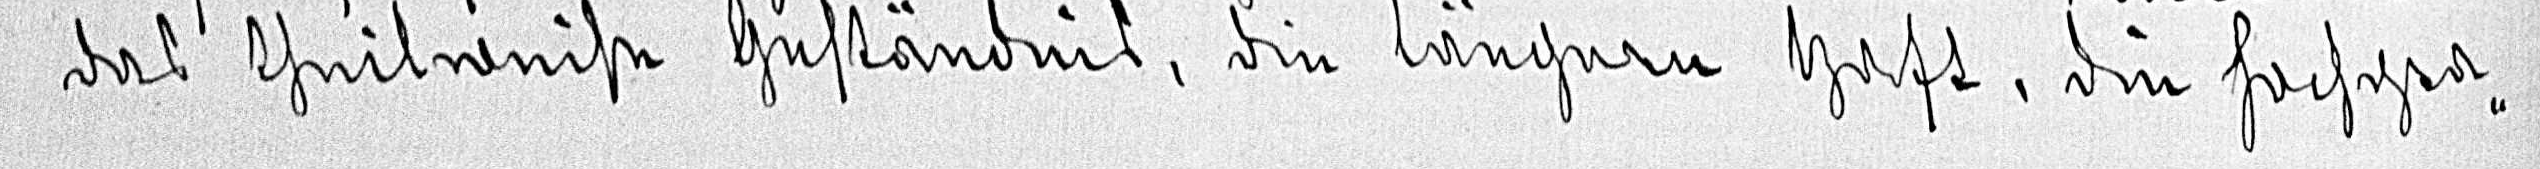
das theilweise Geständnis, die längere Haft, die hochgra¬
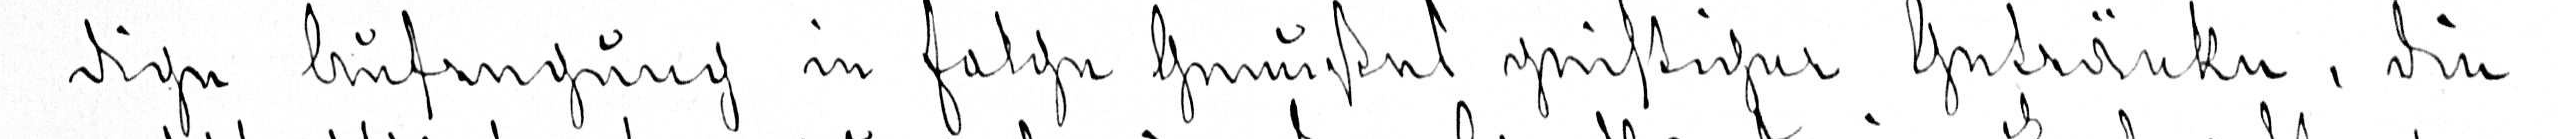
dige Aufregung in Folge Genußes geistiger Getränke, die
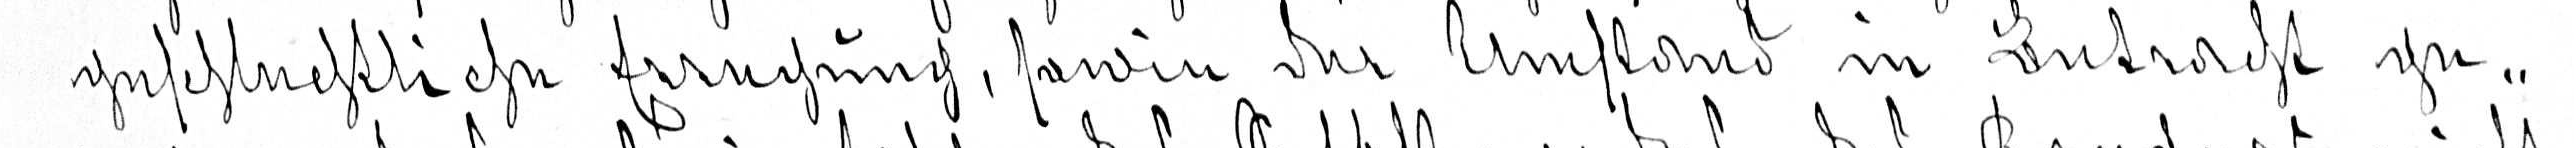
geschlechtliche Erregung, sowie der Umstand in Betracht ge¬
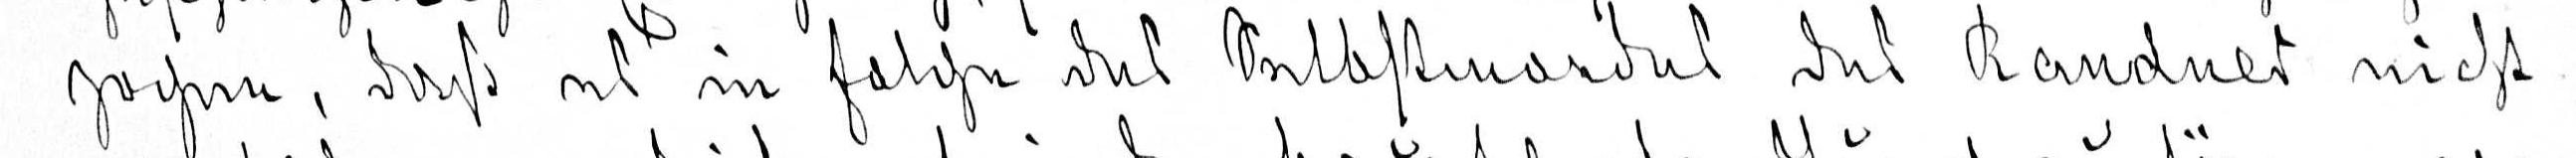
zogen, daß es in Folge des Selbstmordes des Raudner nicht
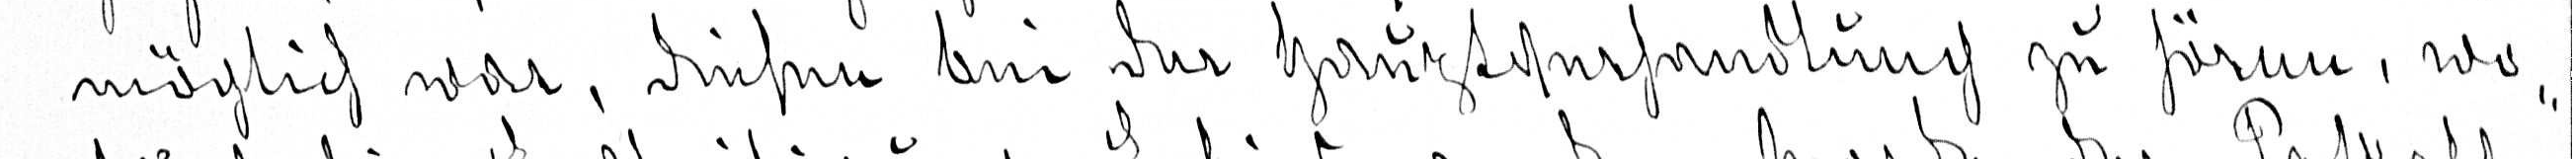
möglich war, diesen bei der Hauptverhandlung zu hören, wo¬
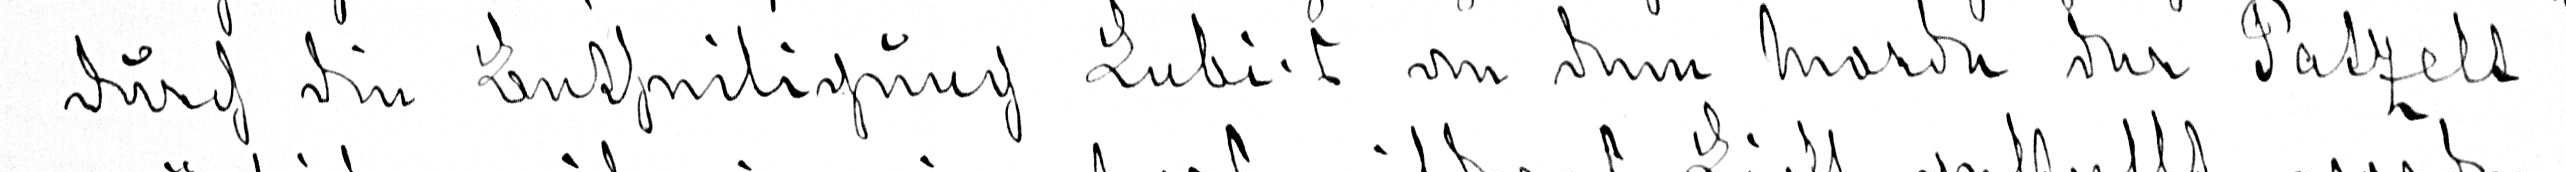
durch die Betheiligung Lubi’s an dem Morde der Patzelt
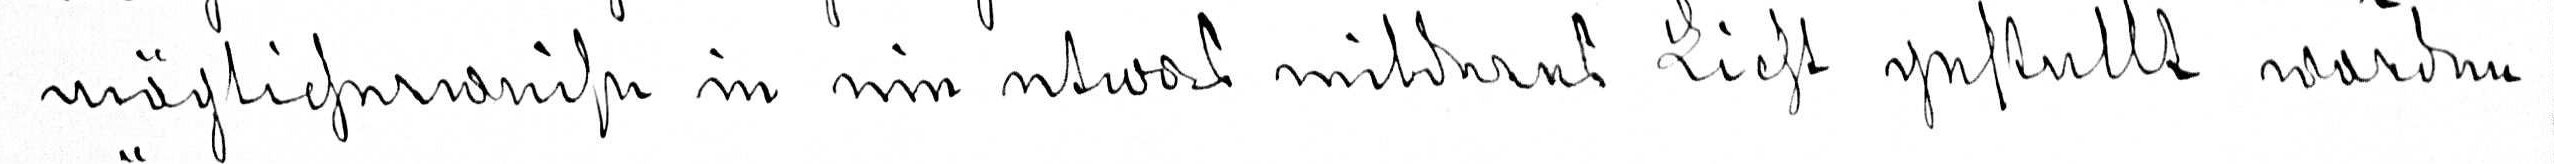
möglicherweise in ein etwas milderes Licht gestellt worden
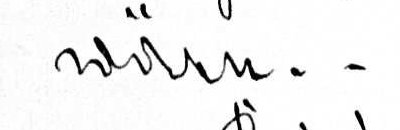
wäre.
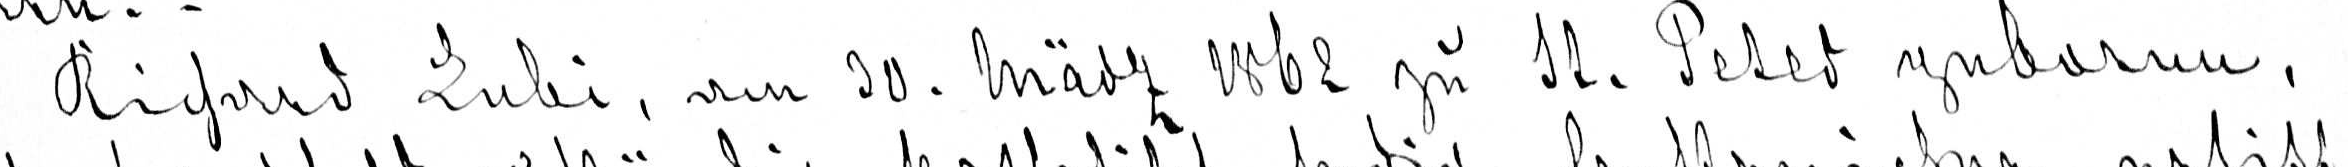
Richard Lubi, am 30. März 1862 zu St. Peter geboren,
